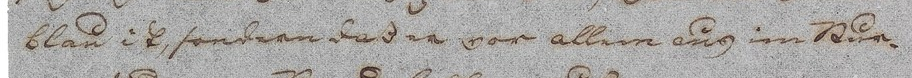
blau ist, sondern daß er vor allem aus im Stur-
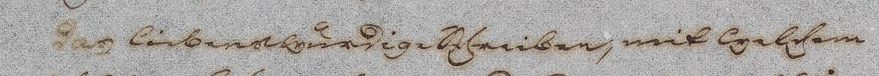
Das liebenswürdige Schreiben, mit welchem
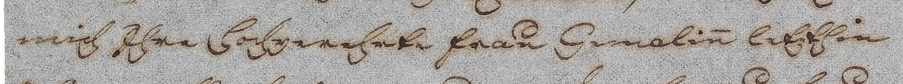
mich Ihre hochverehrte Frau Gemalinn letzthin
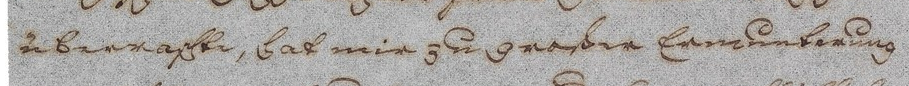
überraschte, hat mir zu großer Ermunterung
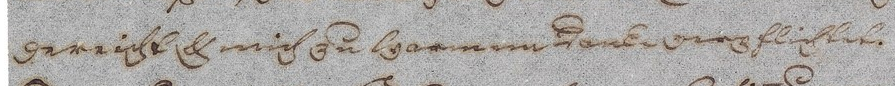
gereicht & mich zu warmem Danke verpflichtet.
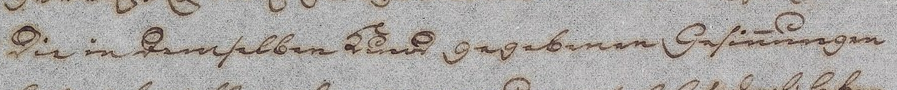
Die in demselben kund gegebenen Gesinnungen
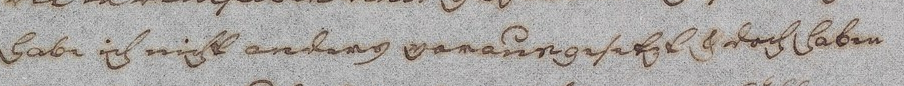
habe ich nicht anders vorausgesetzt & doch haben
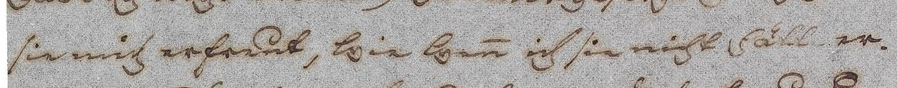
sie mich erfreut, wie wenn ich sie nicht hätte er-
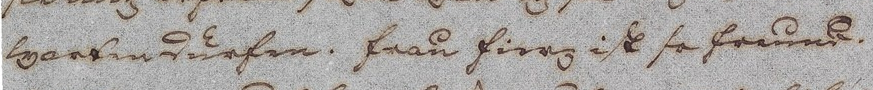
warten dürfen. Frau lFierz ist so freund-
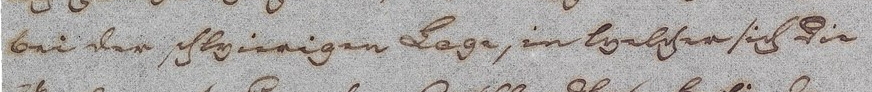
bei der schwierigen Lage, in welcher sich die
